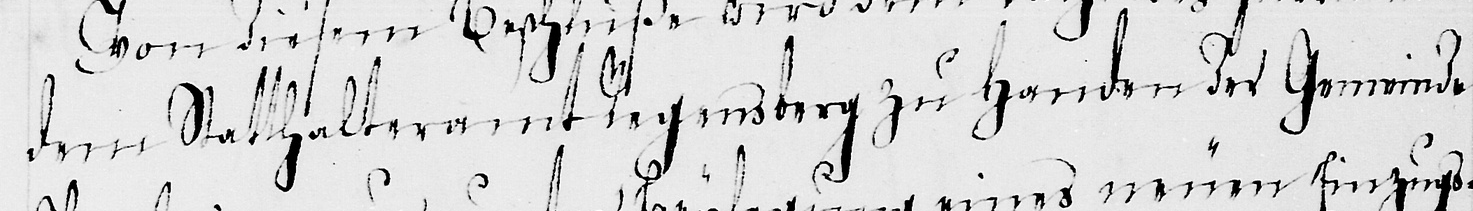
dem Statthalteramt Regensberg zu Handen der Gemeinde
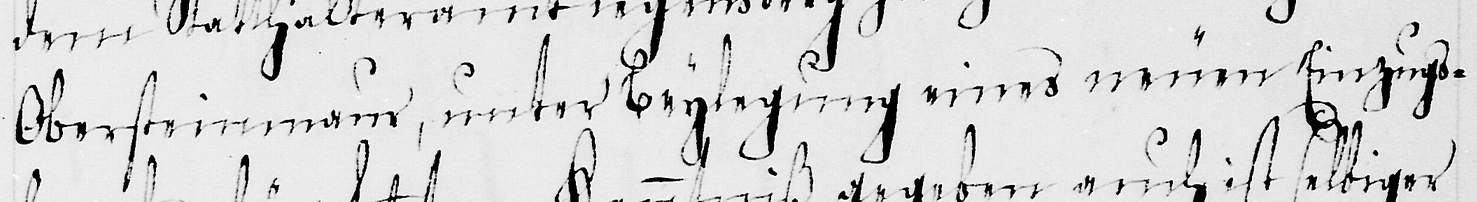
Obersteinmaur, unter Beylegung eines neuen Einzugs¬
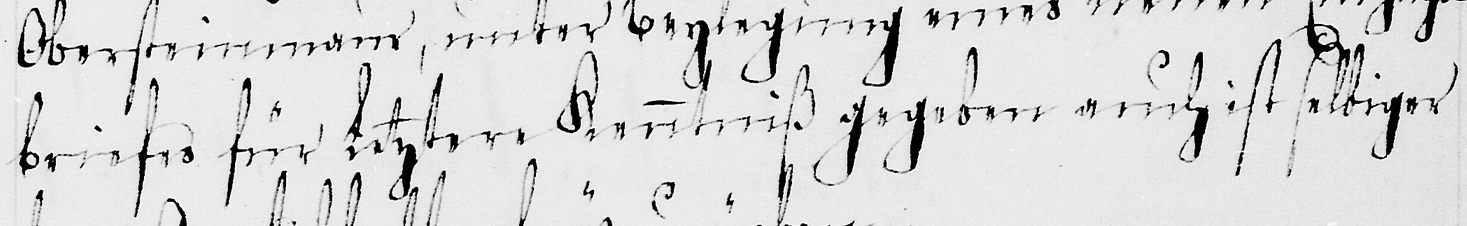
briefes für Letztere Kenntniß gegeben auch ist selbiger
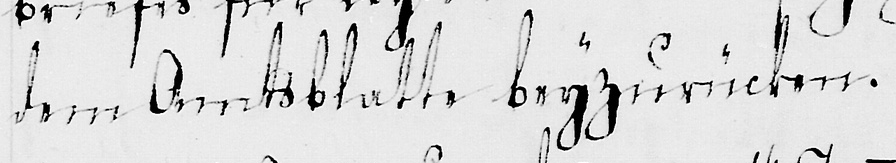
dem Amtblatte beyzurücken.
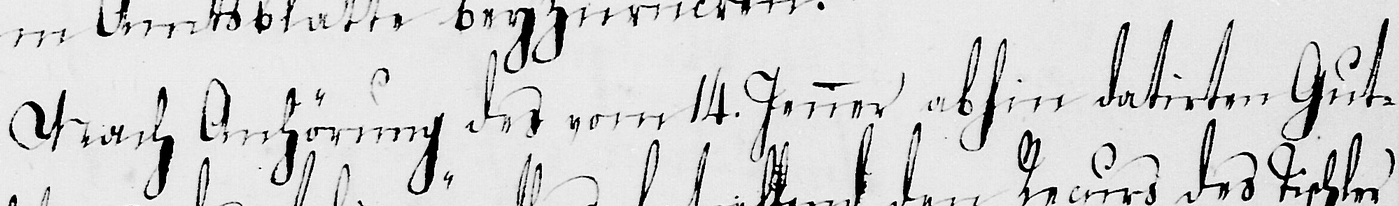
Nach Anhörung des vom 14. Jenner abhin datirten Gut¬
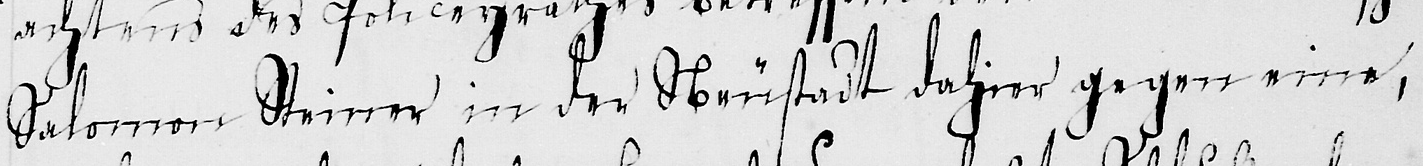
Salomon Steiner in der Neustadt dahier gegen eine,
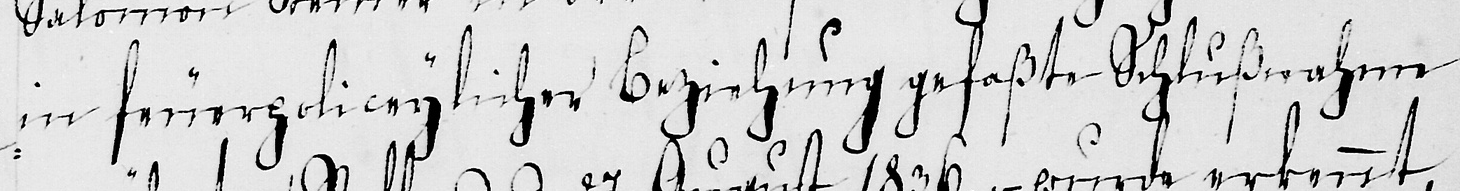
in feuerpoliceylicher Beziehung gefaßte Schlußnahme
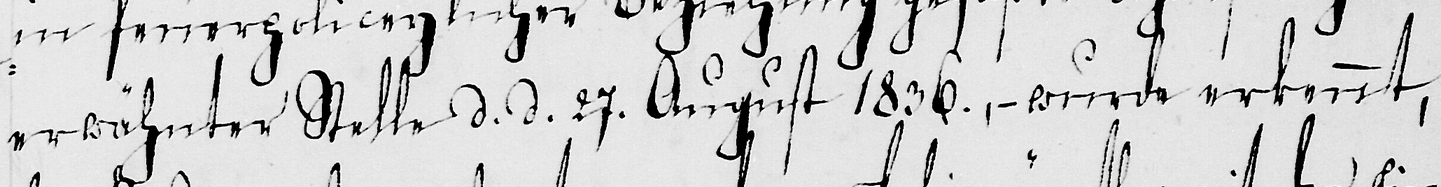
erwähnter Stelle d. d. 27. August 1836., – wurde erkannt,
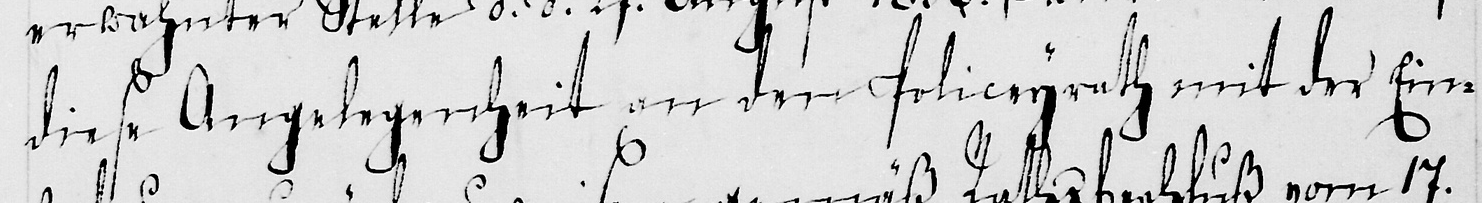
diese Angelegenheit an den Policeyrath mit der Ein¬
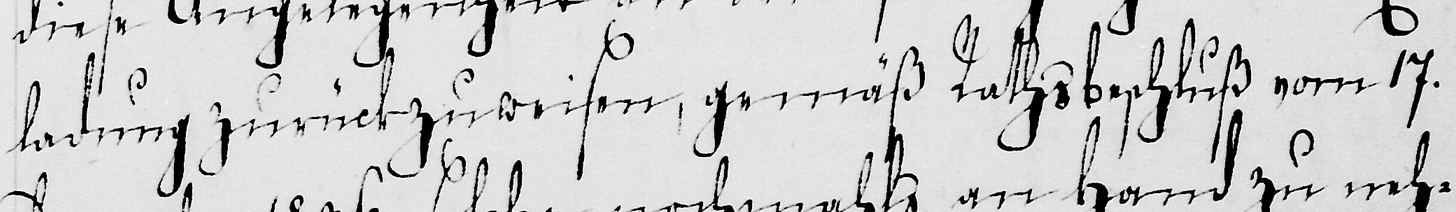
ladung zurückzuweisen, gemäß Rathsbeschluß vom 17.
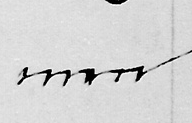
Innern
